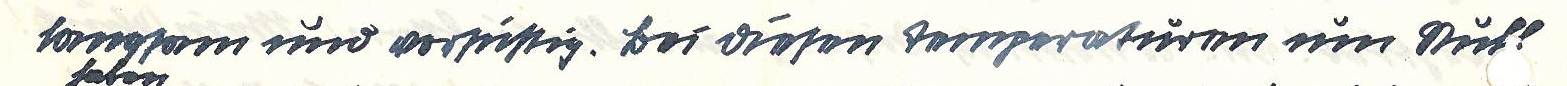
langsam und vorsichtig. Bei diesen Temperaturen um Null
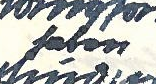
haben
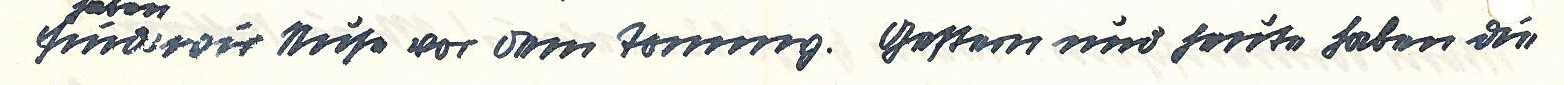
find wir Ruhe vor dem Tommy. Gestern und heute haben die
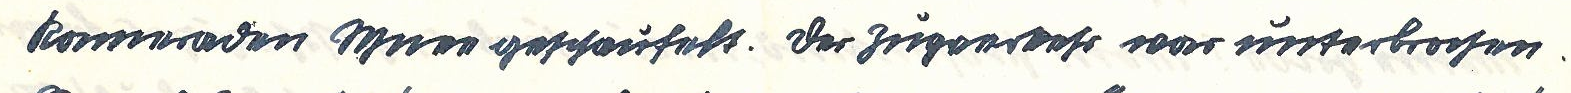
Kameraden Schnee geschaufelt. Der Zugverkehr war unterbrochen.
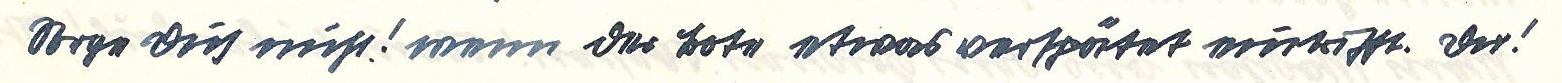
Sorge Dich nicht! wenn der Bote etwas verspätet eintrifft. Du!
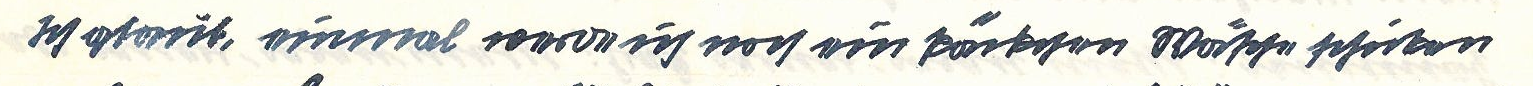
Ich glaub, einmal werde ich noch ein Päckchen Wäsche schicken
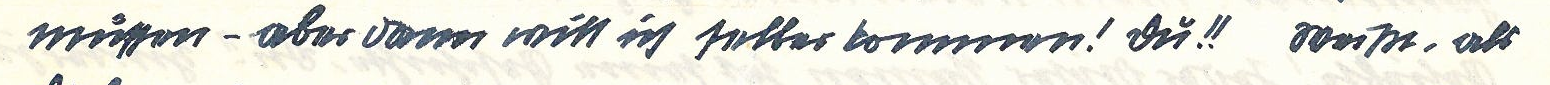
müssen – aber dann will ich selber kommen! Du!! Weißt, als
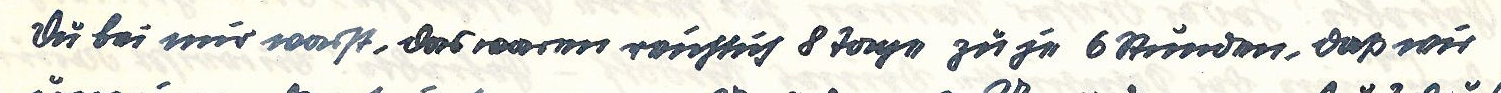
Du bei mir warst, das waren reichlich 8 Tage zu je 6 Stunden, daß wir
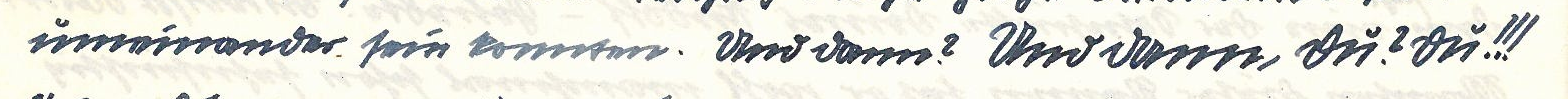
umeinander sein konnten. Und dann? Und dann, Du? Du!!!
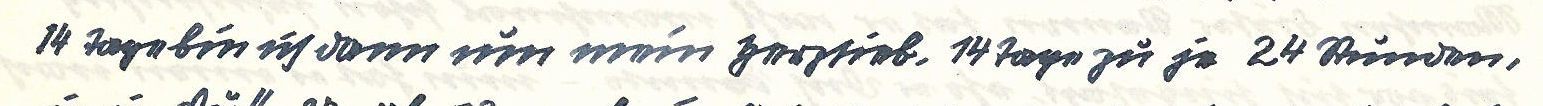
14 Tage bin ich dann um mein Herzlieb. 14 Tage zu je 24 Stunden,
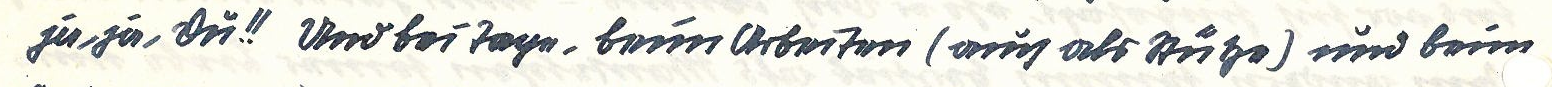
ja, ja, Du!! Und bei Tage, beim Arbeiten (auch als Stütze) und beim
